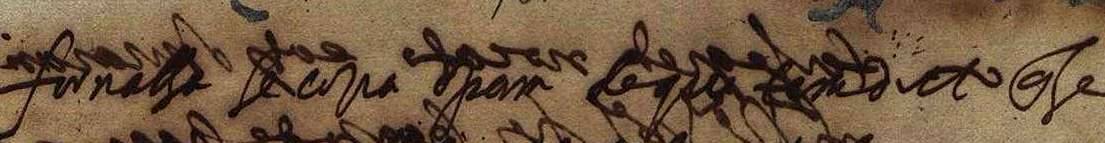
fornalha se cozia o pam de que tem dicto q̄ se
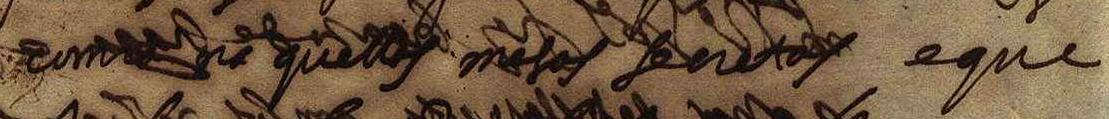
comia naquellas mesas secretas e que
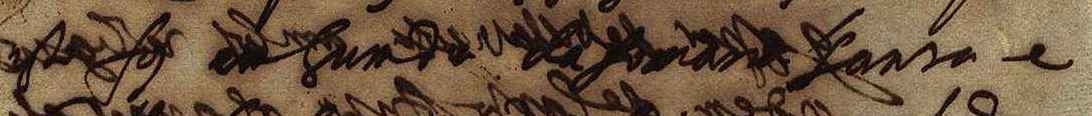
isto foj em hum dia da somana santa e
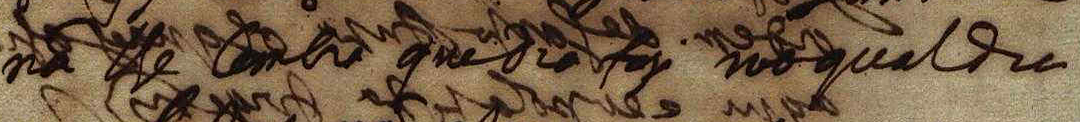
nā lhe lembra que dia foy no qual dia
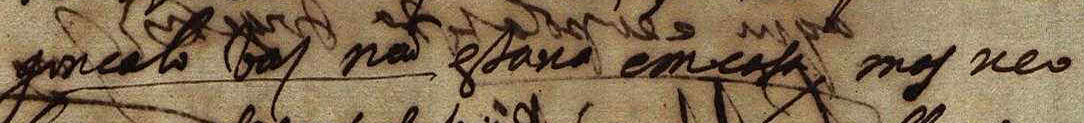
gonçalo Vaz naõ estaua em casa, mas ueo
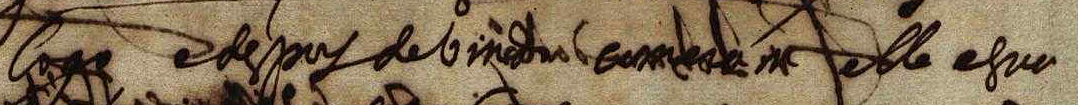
logo e despois de vindo comeram elle e sua
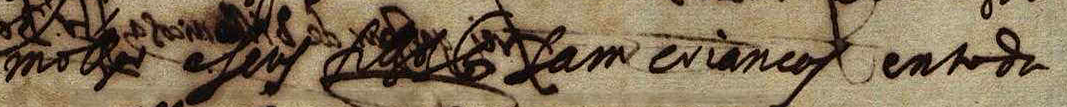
molher e seus filhos q̄ sam crianças en toda
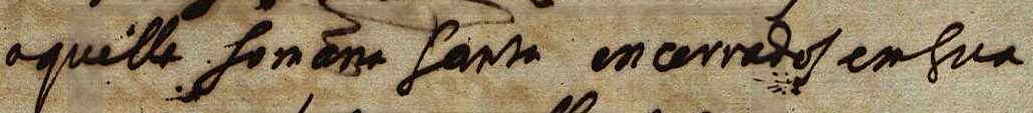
aquella somana santa encerrados em sua
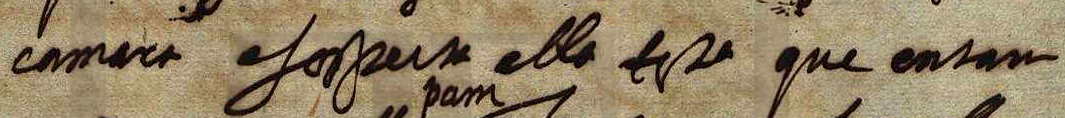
camara e sospeita ella testa que entam
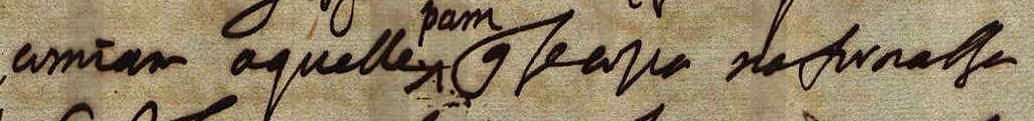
comiam aquelle pam q̄ se cozia na fornalha
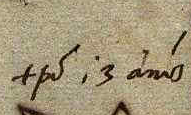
tpō 13 anōs
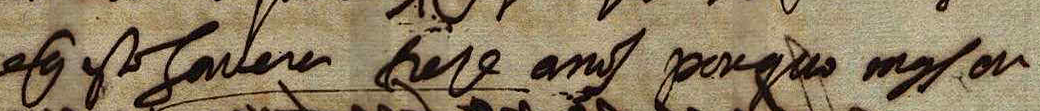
e q̄ isto hauera treze anos pouquo majs ou
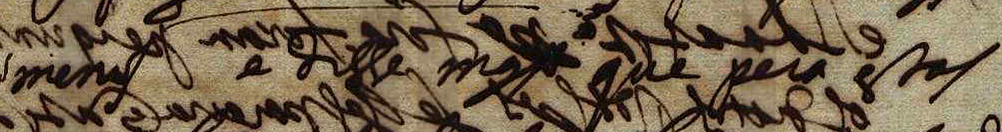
menos e disse majs que pera estas
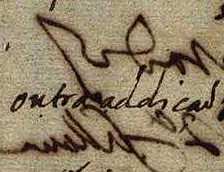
outra addição
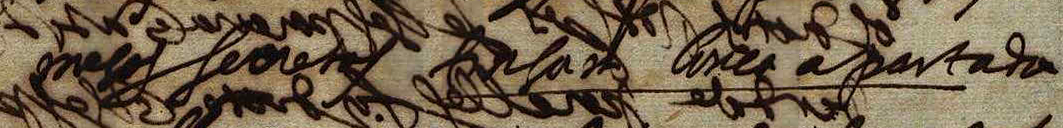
mesas secretas tinham louça apartada
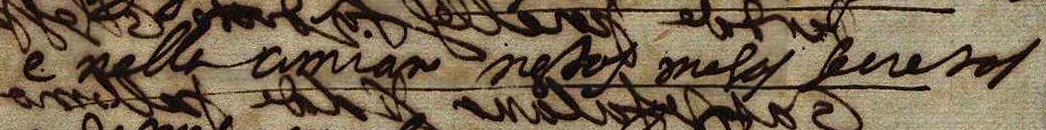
e nella comiam nestas mesas secretas
